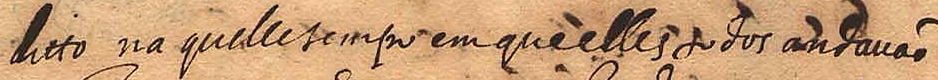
ditto naquelle tempo em que elles todos andauaõ
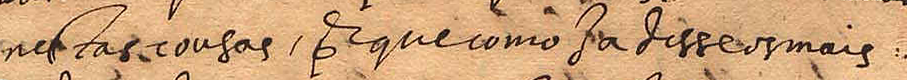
nestas cousas / pr que como Ja disse os mais
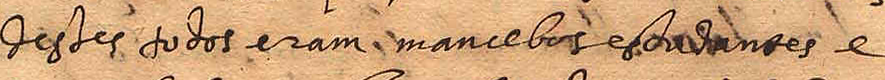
destes todos eram mancebos estudantes e
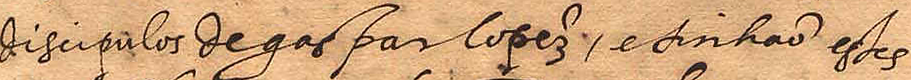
discipulos de gaspar lopez̄ / e tinhaõ estes
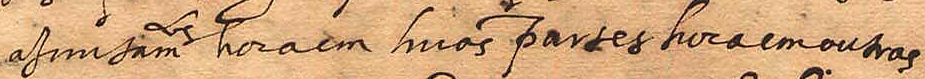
aJuntamtos hora em huās partes hora em outras
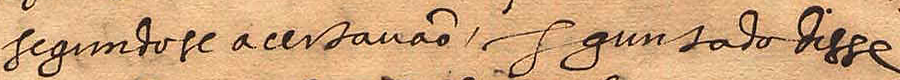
segundo se acertauão / ꝑguntado disse
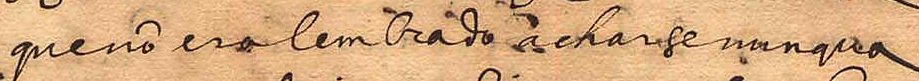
que nō era lembrado acharse nunqua
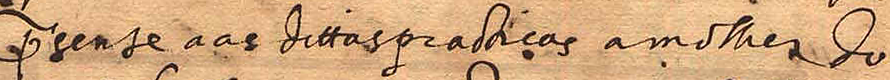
p̄sente aas dittas practicas a mulher do
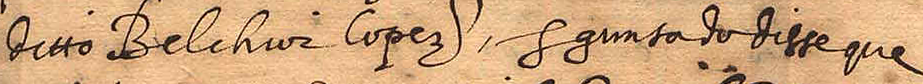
ditto Belchior lopez̄ / ꝑguntado disse que
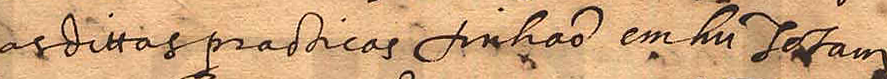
as dittas practicas tinhaõ em hū sotam
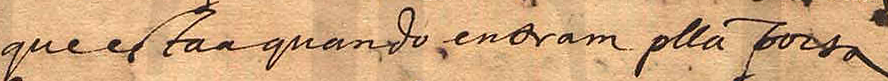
que estaa quando entram pllā porta
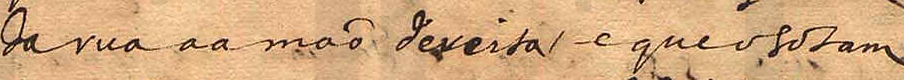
da rua aa maõ dereita / e que o sotam
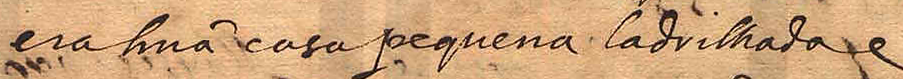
era huā casa pequena ladrilhada e
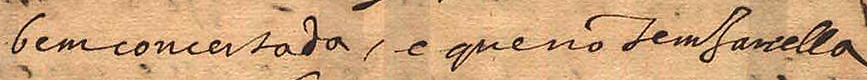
bem concertada / e que nō tem Janella
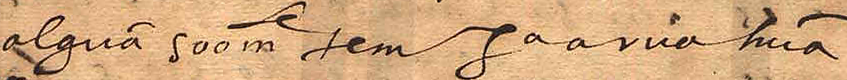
alguā soomte tem ꝑa a rua huā
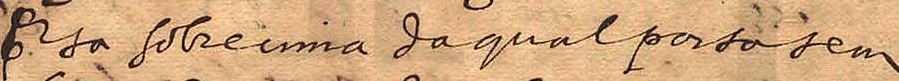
prta sobre cima da qual porta tem
